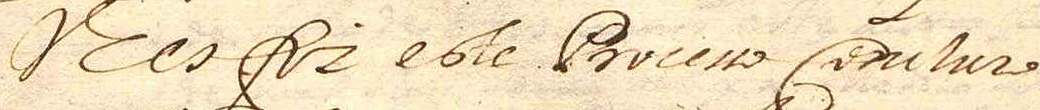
lhes fiz este Processo Concluzo
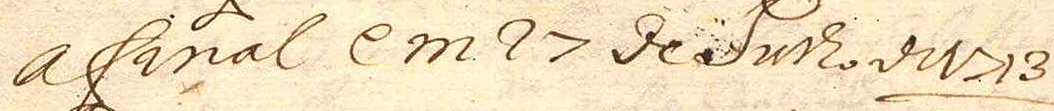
afinal em 27 de Iulho de 1713
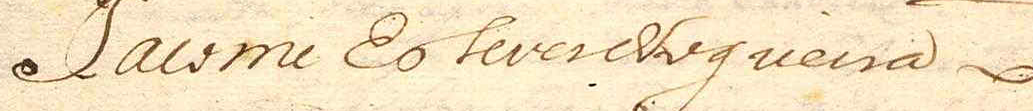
Iacome Esteves Nogueira o
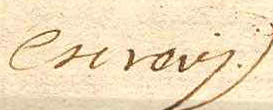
escrevj
